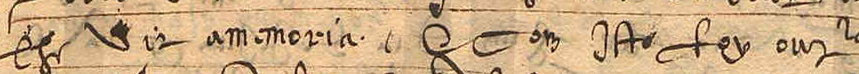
lhe vir a memoria / e com Jsto foy outra
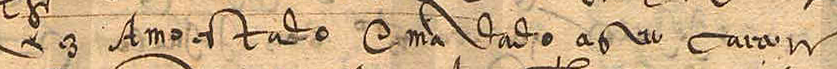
vez Amoestado e mādado a seu carcere
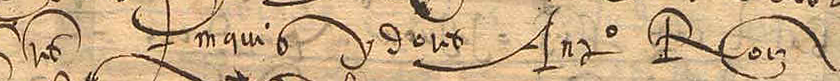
Sr̄es Jmquisydores Anto Rōiz
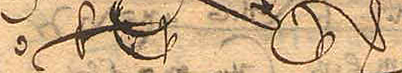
o stp̄vy
